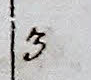3
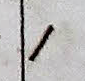1
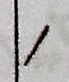1
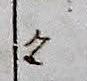2
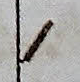1
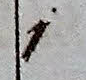1
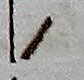1
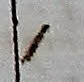1
